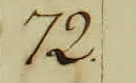72.
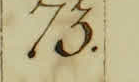73.
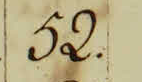52.
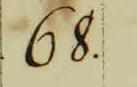68.
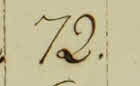72.
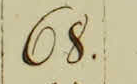68.
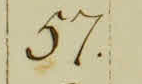57.
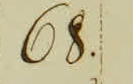68.
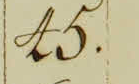45.
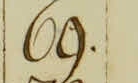69.
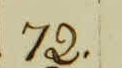72.
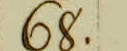68.
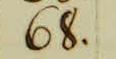68.
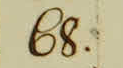68.
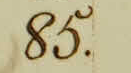85.
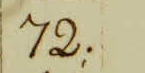72.
